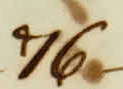76
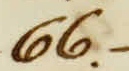66.
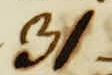31
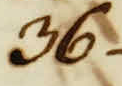36
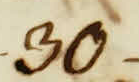30
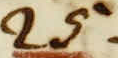25
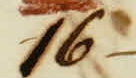16
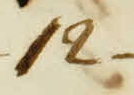12
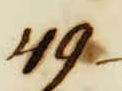49
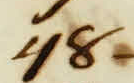48
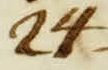24
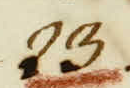23
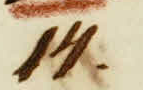14.
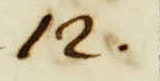12.
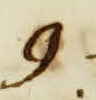9
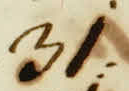31
